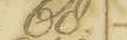68.
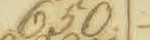650.
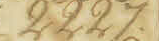2227.
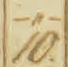10.
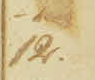12.
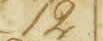12
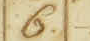6.
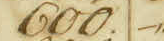600.
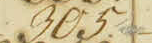305.
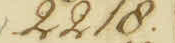2218.
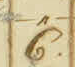6.
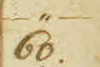60.
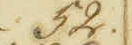52.
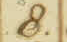8.
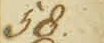58.
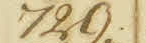729.
